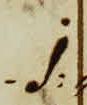1:
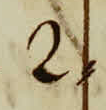2
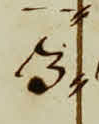3
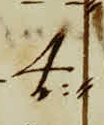4:
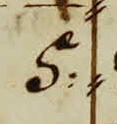5:
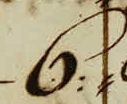6:
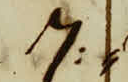7:
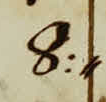8:
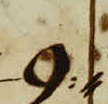9:
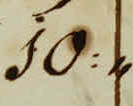10:
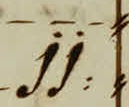11:
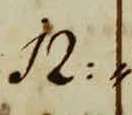12:
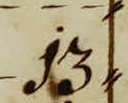13
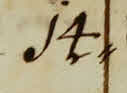14
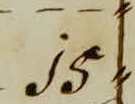15
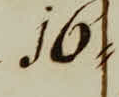16
